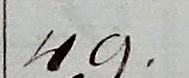49.
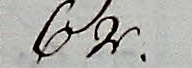62.
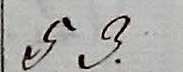53.
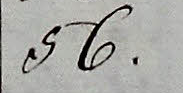56.
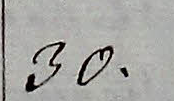30.
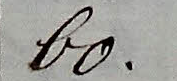60.
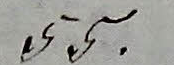55.
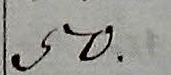50.
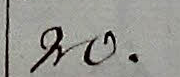20.
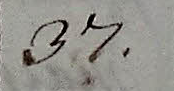37.
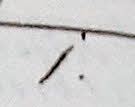1.
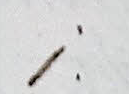1.
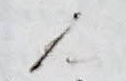1.
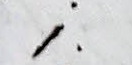1.
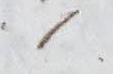1
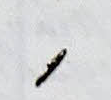1
